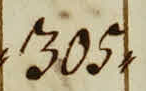305
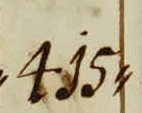415
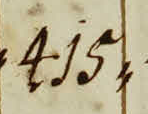415
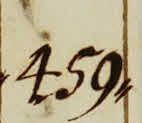459
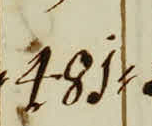481
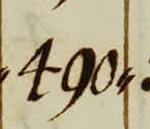490
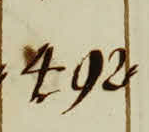492
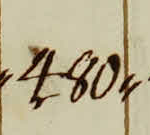480
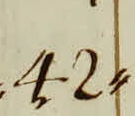42
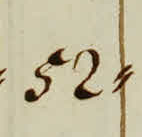52
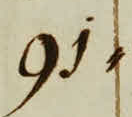91
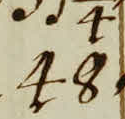48
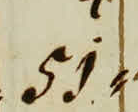51
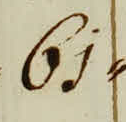61
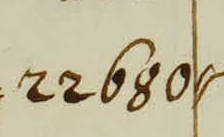22680
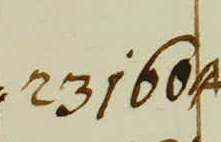23160
